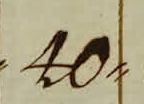40
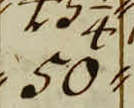50
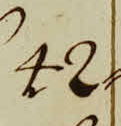42
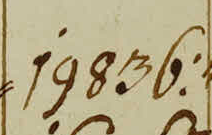19836.
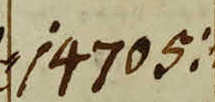14705
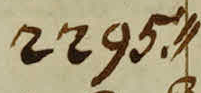2295.
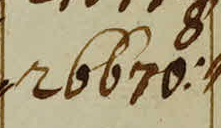26670.
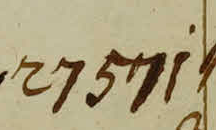27571
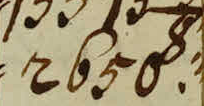2650
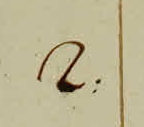2:
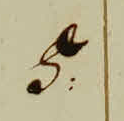5:
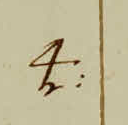4:
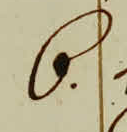6.
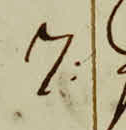7:
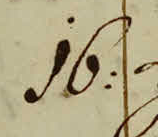16:
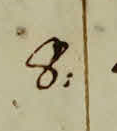8:
